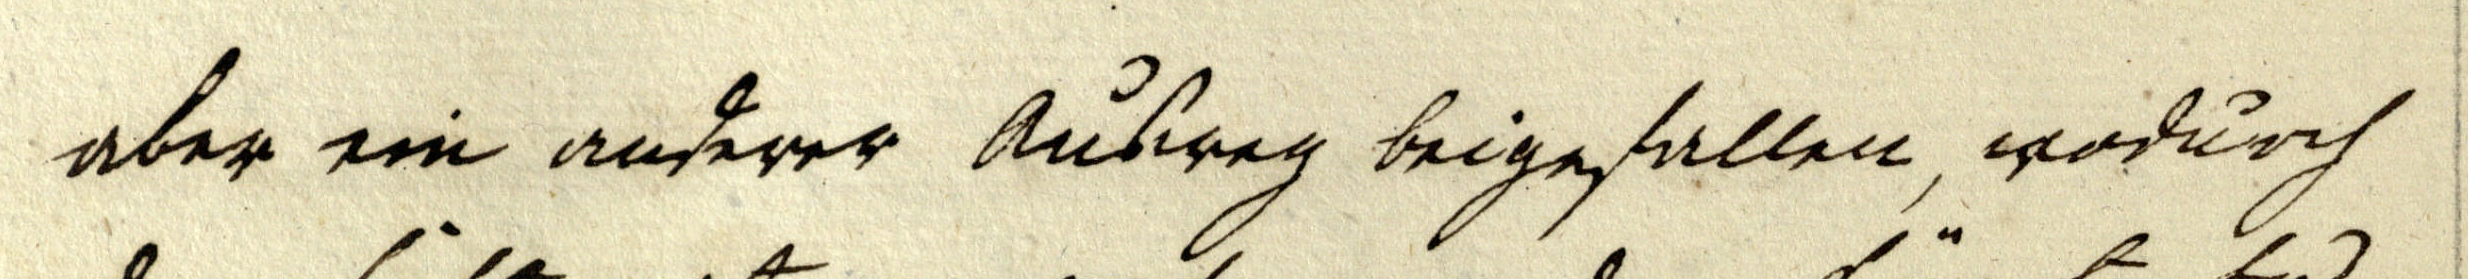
aber ein anderer Ausweg beigefallen, wodurch
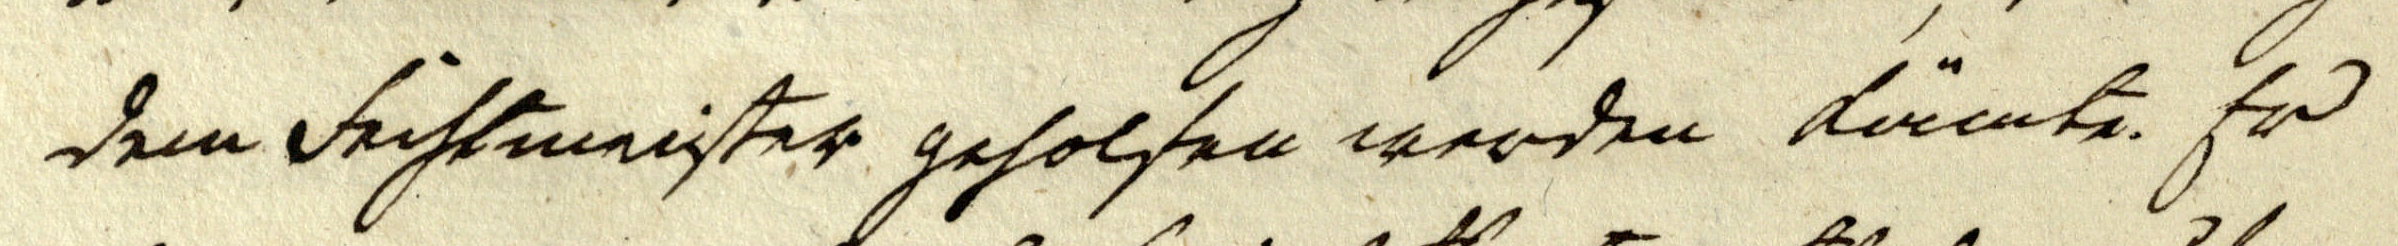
dem Fechtmeister geholfen werden könnte. Er
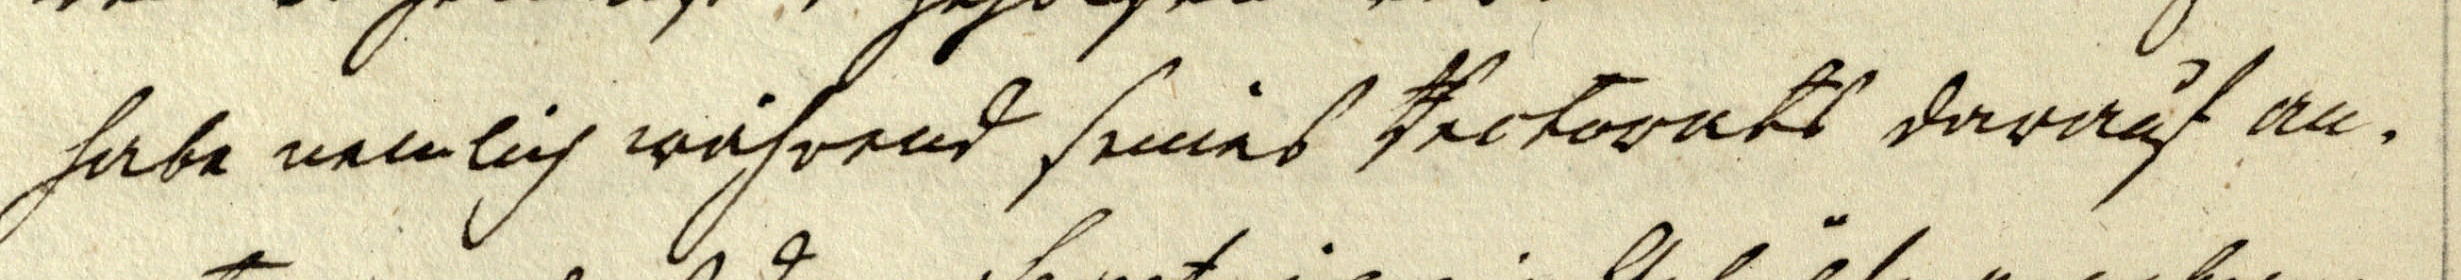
habe nemlich während seines Rectorats darauf an¬
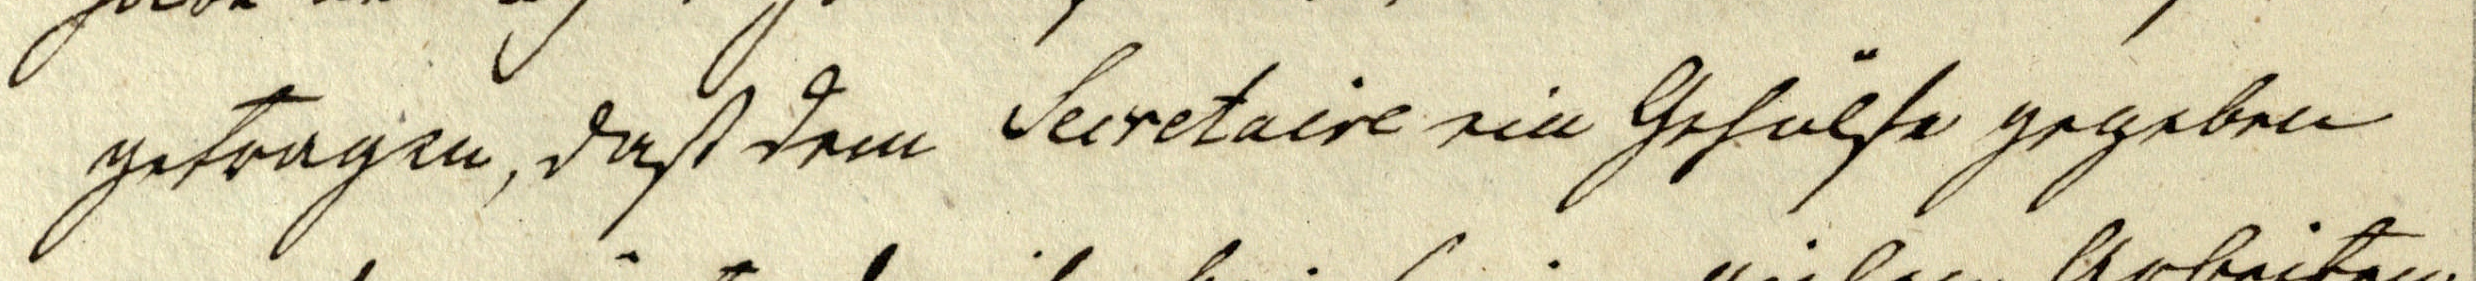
getragen, daß dem Secretaire ein Gehülfe gegeben
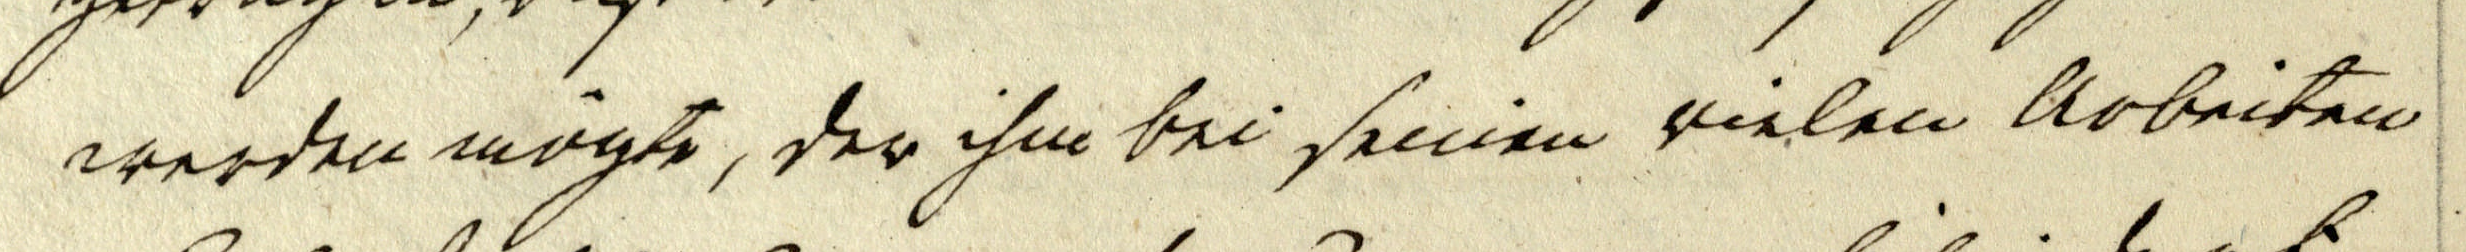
werden mögte, der ihm bei seinen vielen Arbeiten
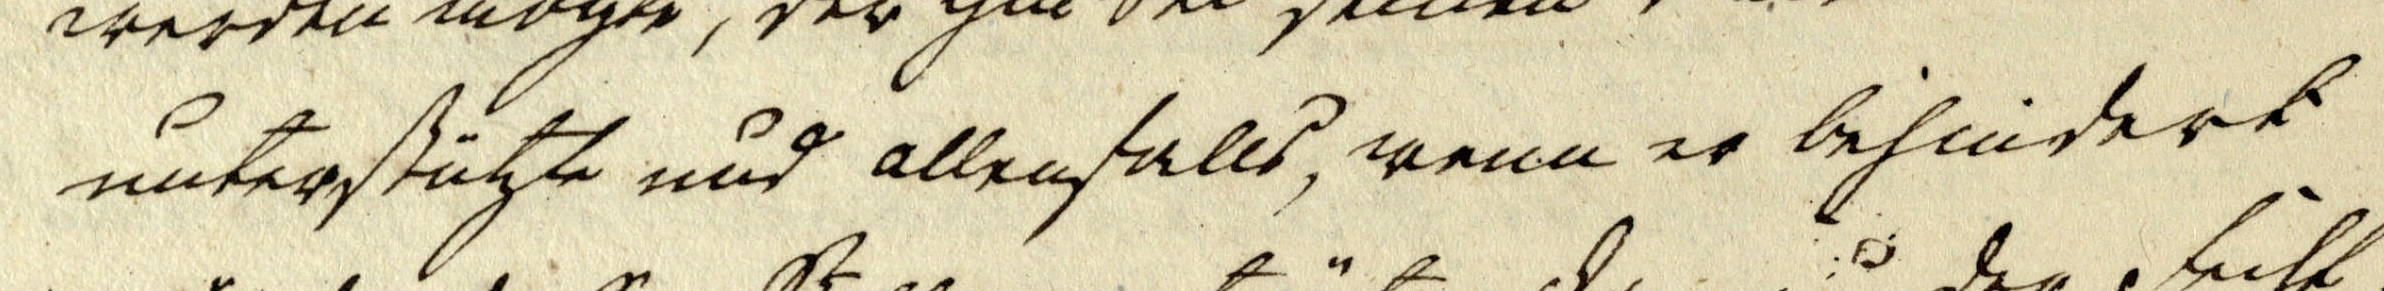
unterstützte und allenfalls, wenn er behindert
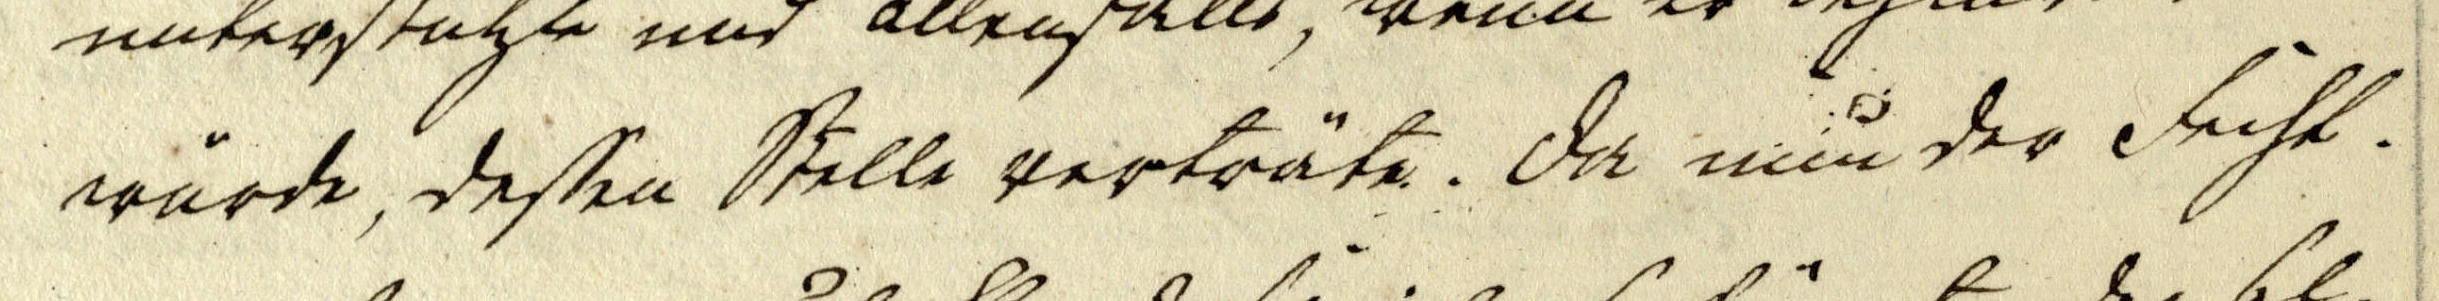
würde, dessen Stelle verträte. Da nun der Fecht¬
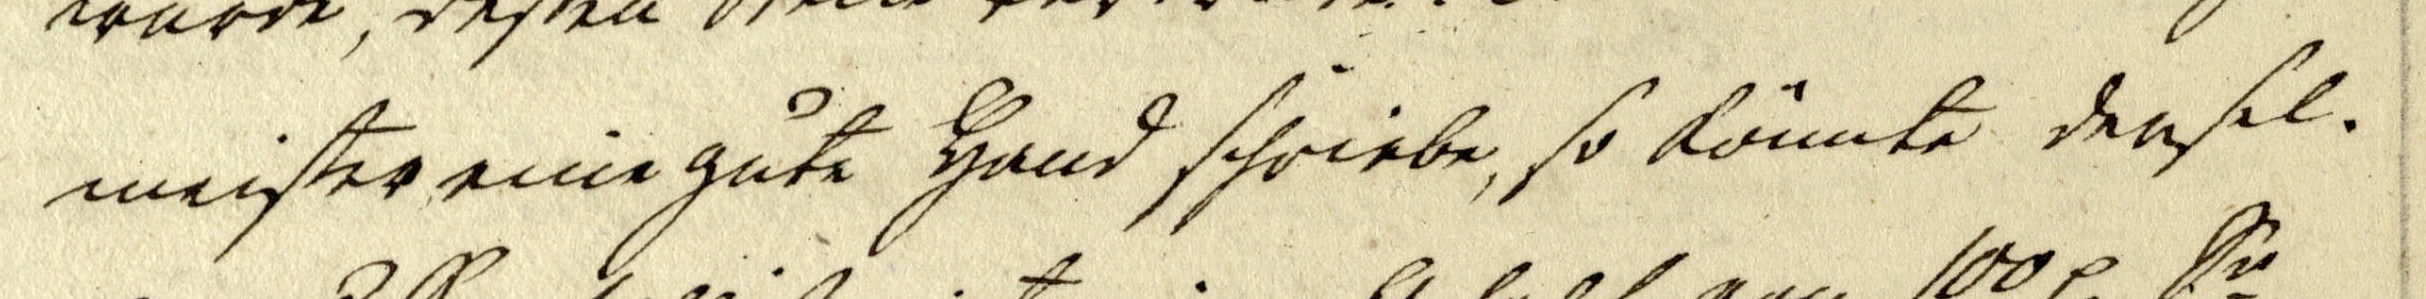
meister eine gute Hand schriebe, so könnte dersel¬
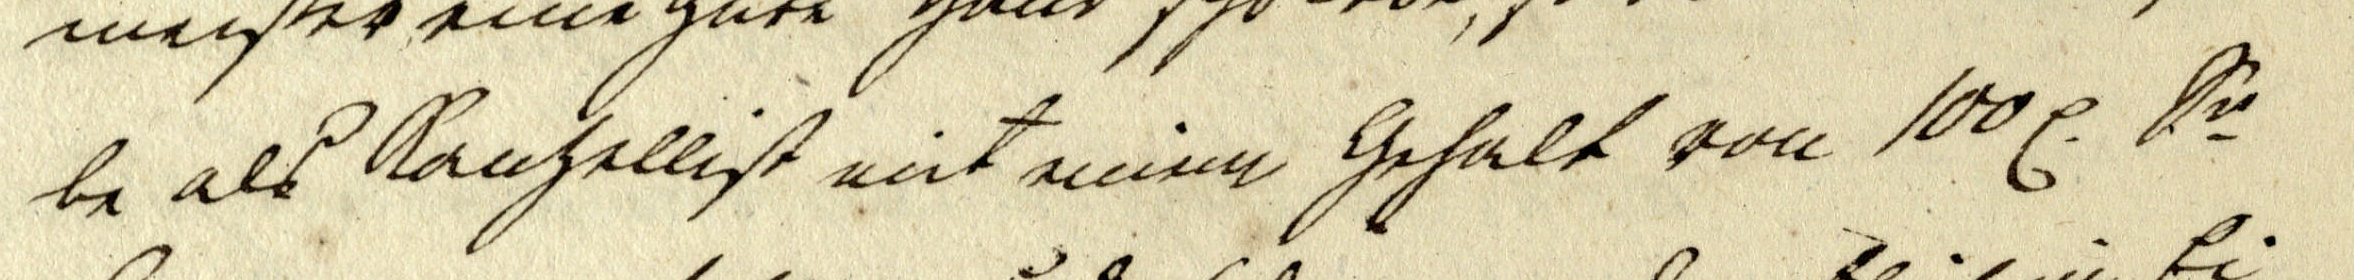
be als Kanzellist mit einem Gehalt von 100 l. Sr
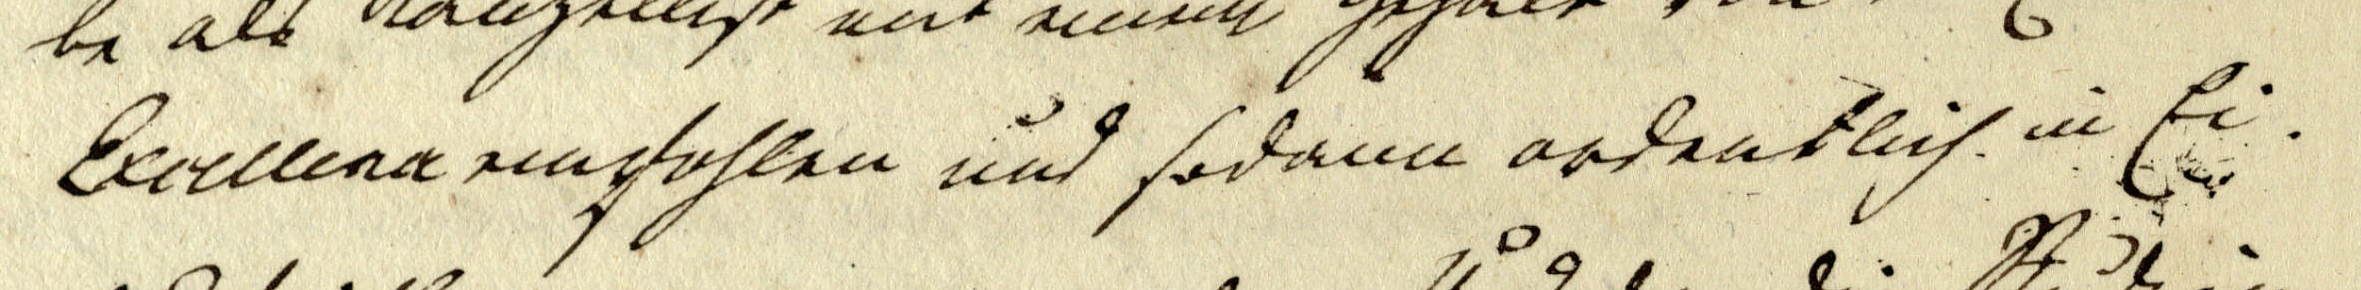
Excellence empfohlen und sodann ordentlich in Ei¬
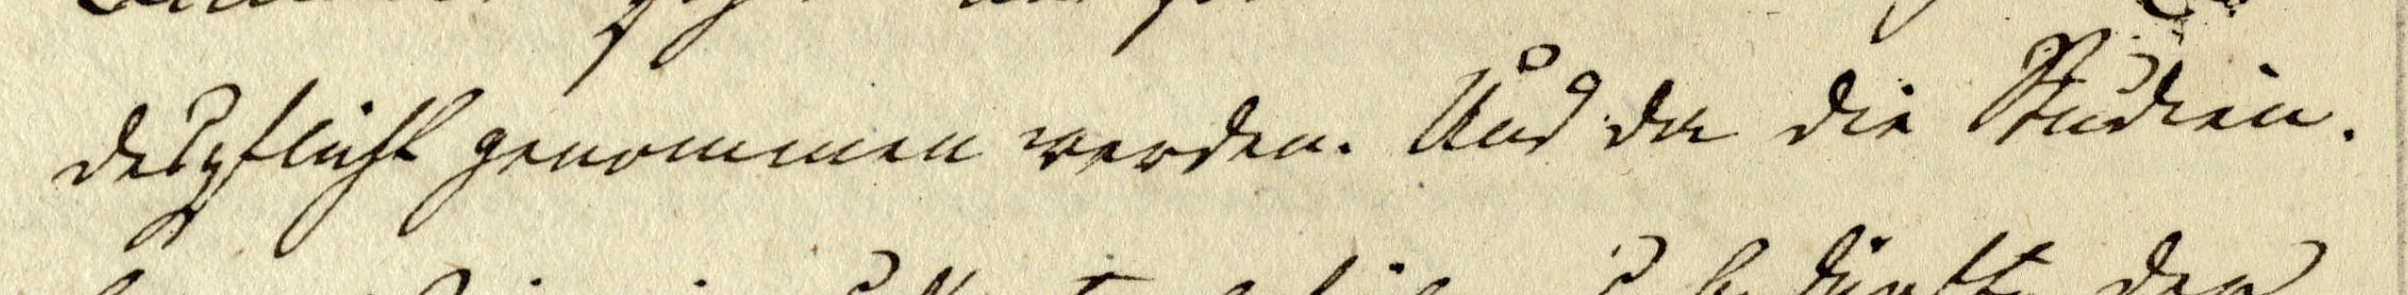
despflicht genommen werden. Und da die Studien¬
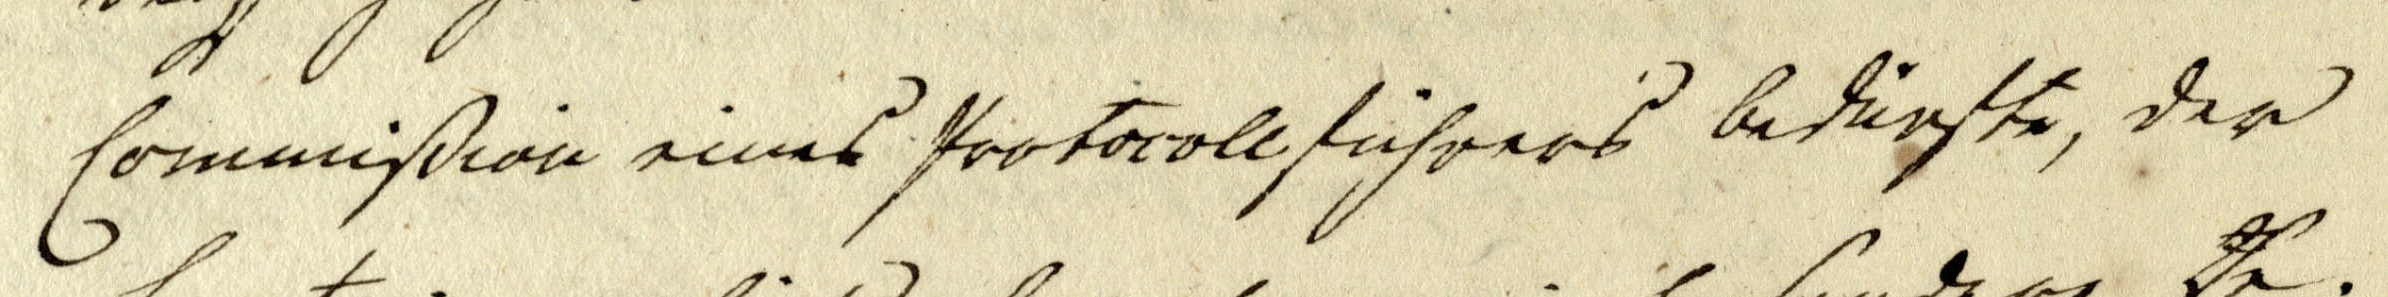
Commission eines Protocollführers bedürfte, der
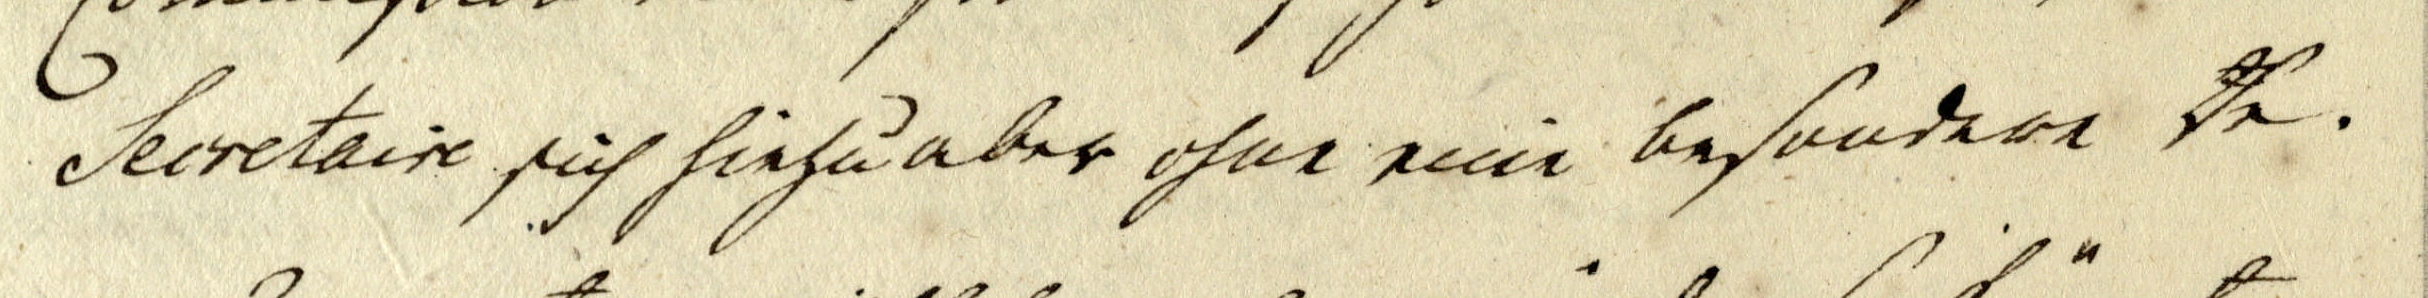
Secretaire sich hiezu aber ohne eine besondere Re¬
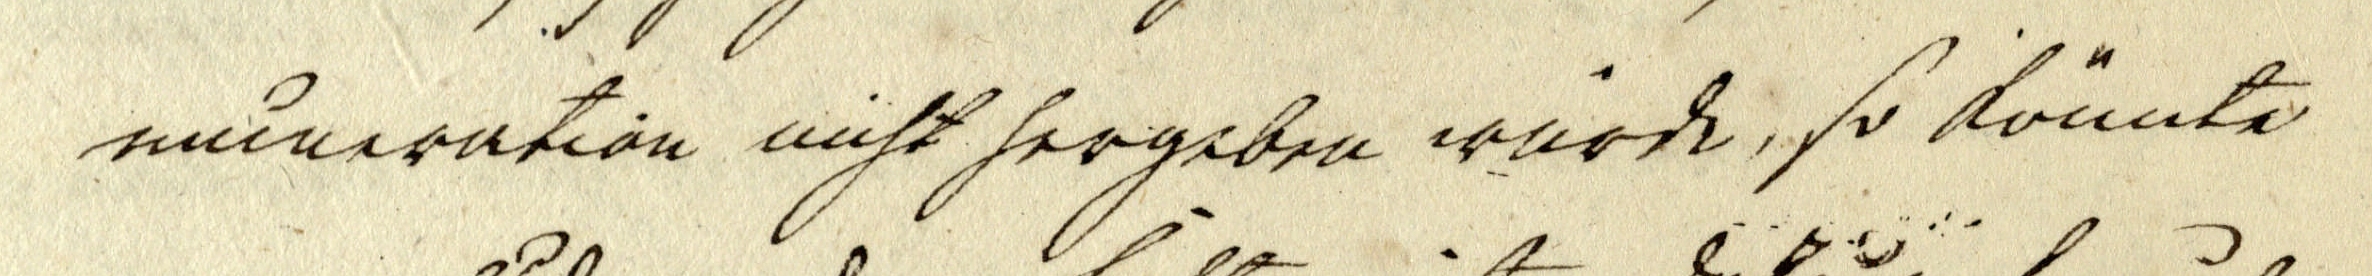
muneration nicht hergeben würde, so könnte
